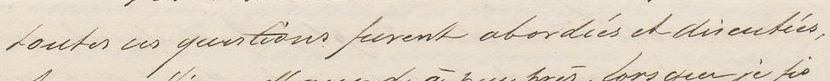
toutes ces questions furent abordées et discutées,
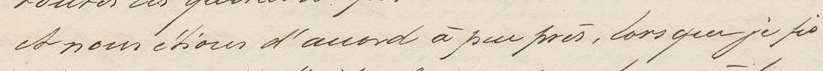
et nous étions d'accord à peu près, lors que je fis
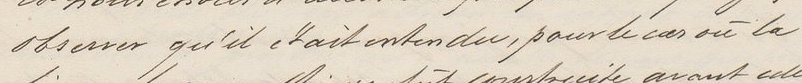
observer qu'il était entendu, pour le cas où la
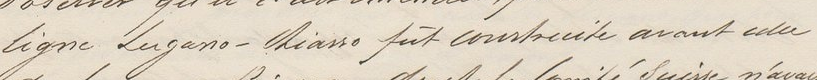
ligne Lugano–Chiasso fût construite avant celle
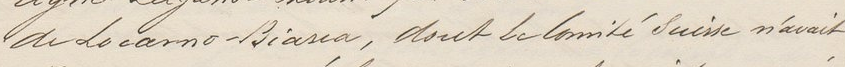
de Locarno–Biasca, dont le Comité Suisse n'avait
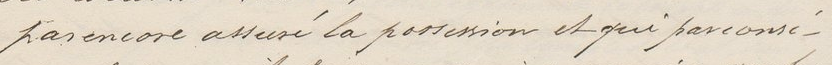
pas encore assuré la possession et qui par consé-
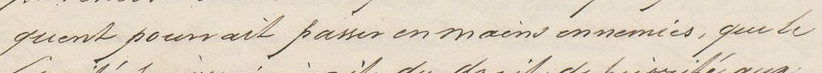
quent pourrait passer en mains ennemies, que le
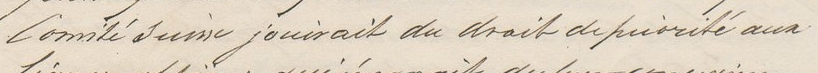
Comité Suisse jouirait du droit de priorité aux
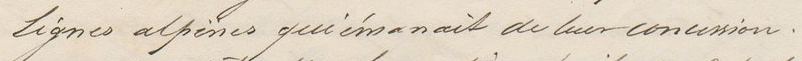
lignes alpines qui émanait de leur concession.
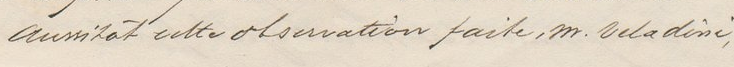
Aussitôt cette observation faite, M. Veladini,
